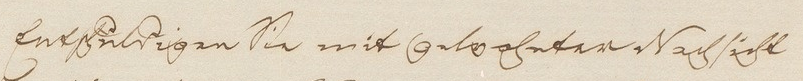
Enschuldigen Sie mit gewohnter Nachsicht
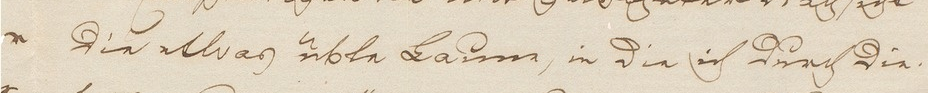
die etwas üble Laune, in die ich durch die-
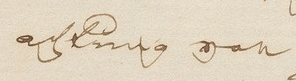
achtung von
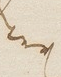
Bern
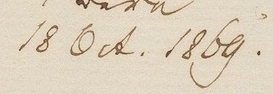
18 Oct. 1869.
